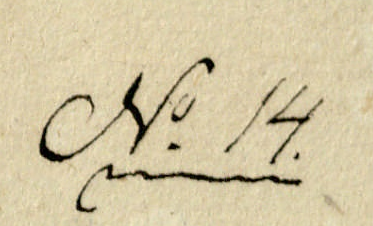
No 14.
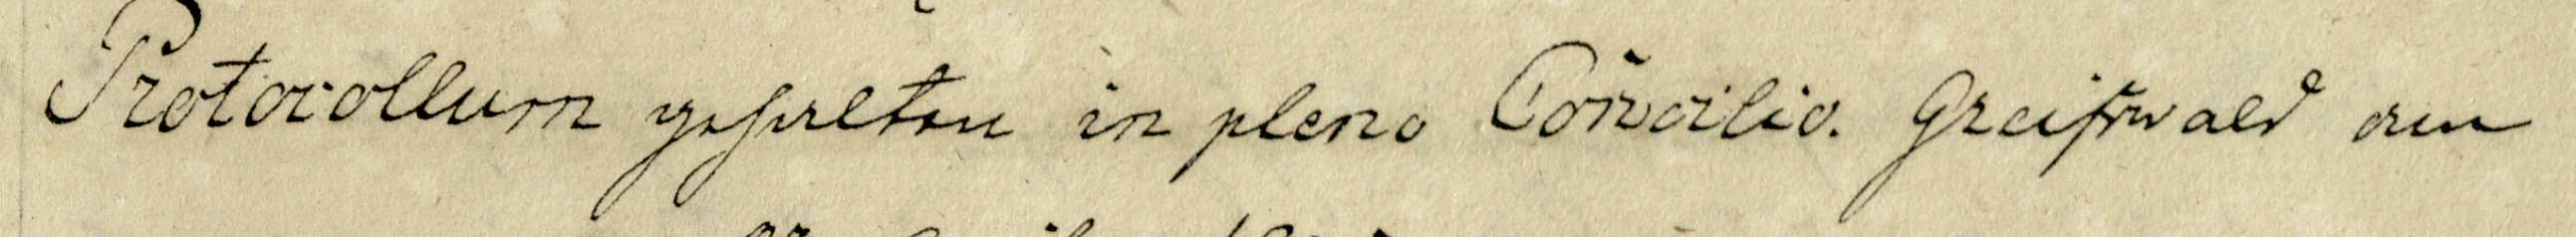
Protocollum gehalten in pleno Concilio. Greifswald am
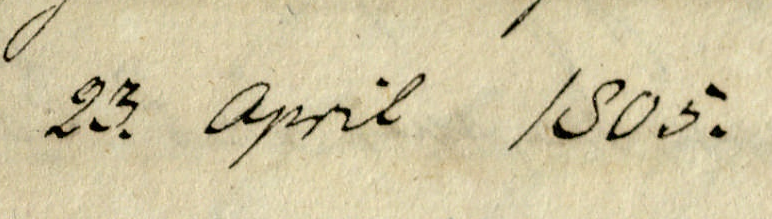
23. April 1805.
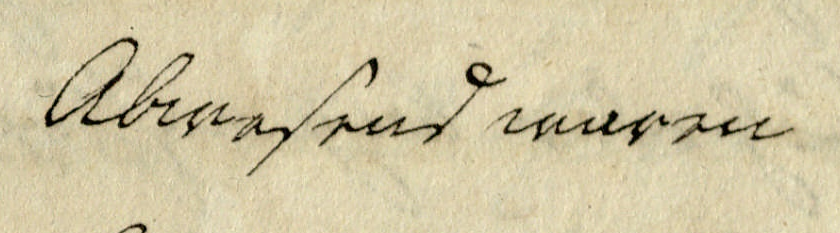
Abwesend waren
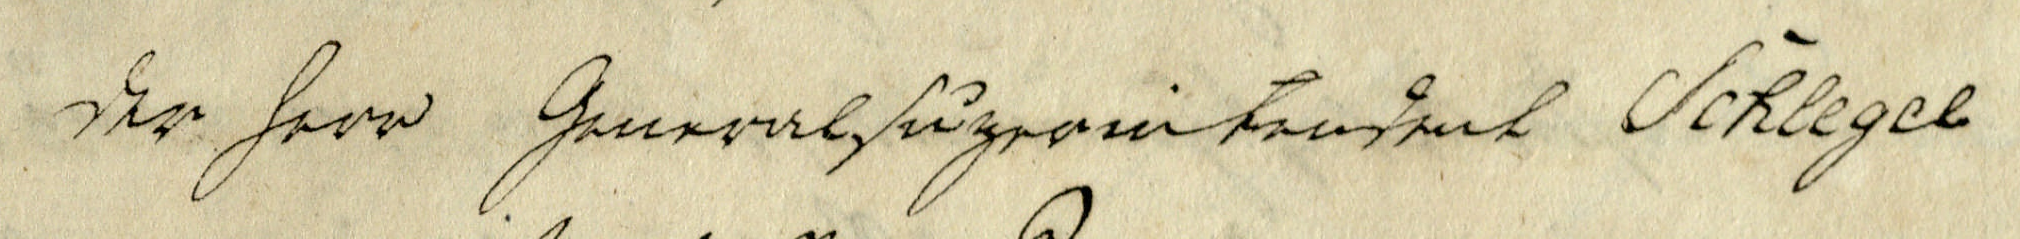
der Herr Generalsuperintendent Schlegel
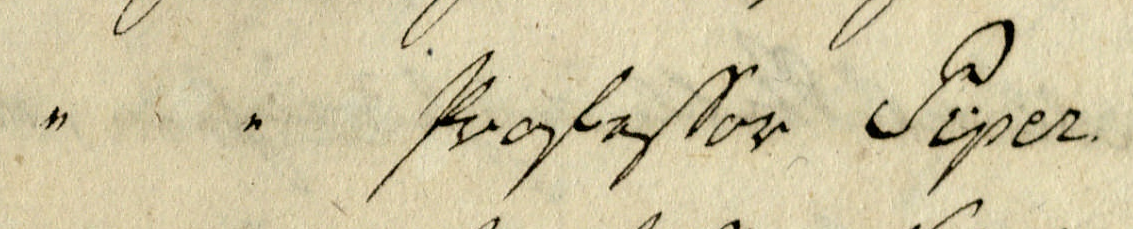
Professor Piper.
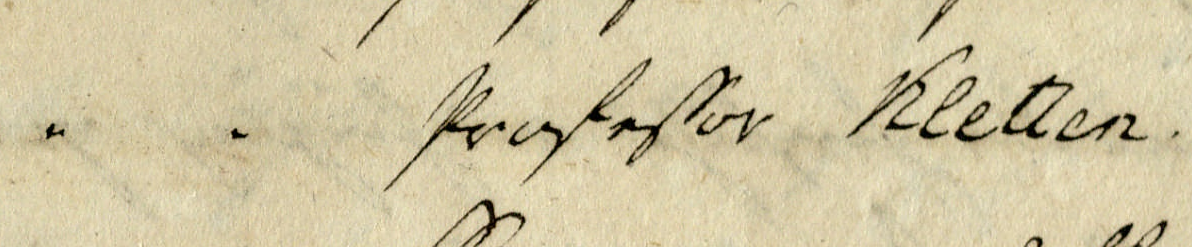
Professor Kletten
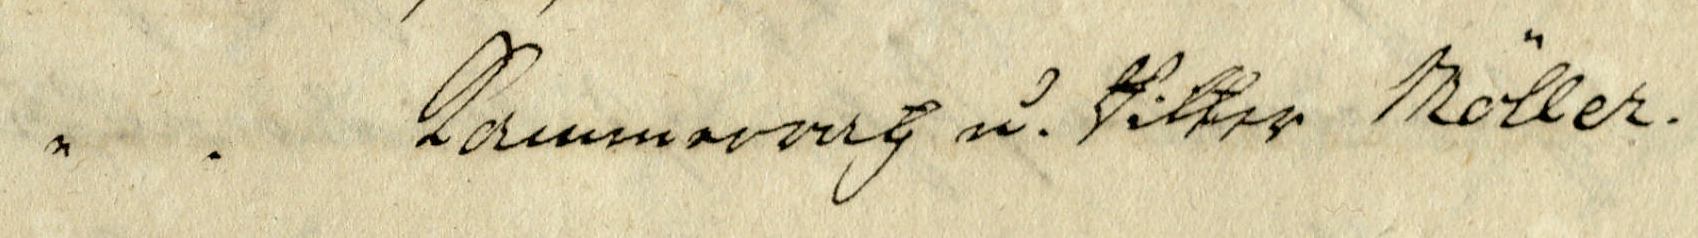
Kammerrath u. Ritter Möller
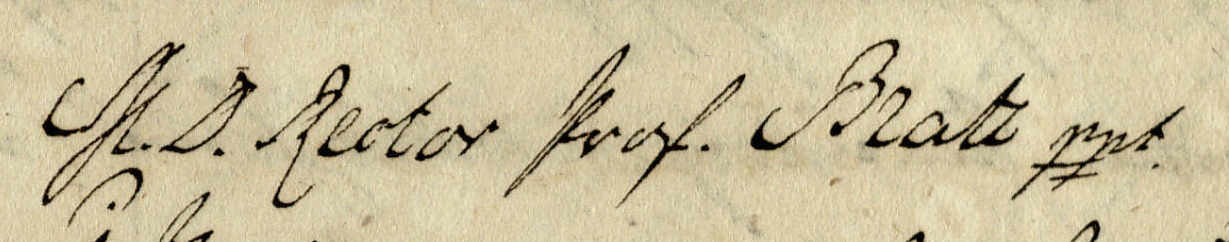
M. D. Rector Prof. Bratt ppt
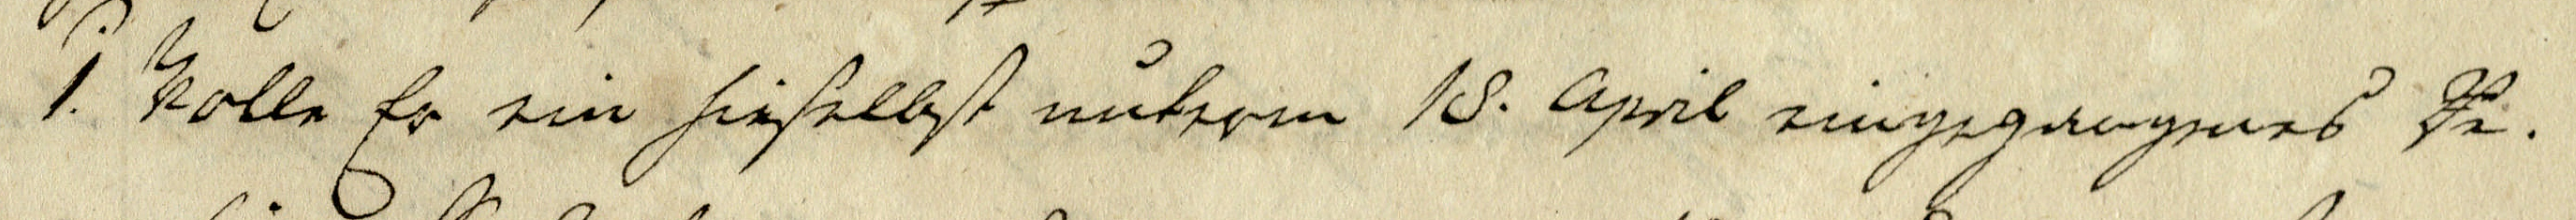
1. Wolle Er ein hieselbst unterm 18. April eingegangenes Re¬
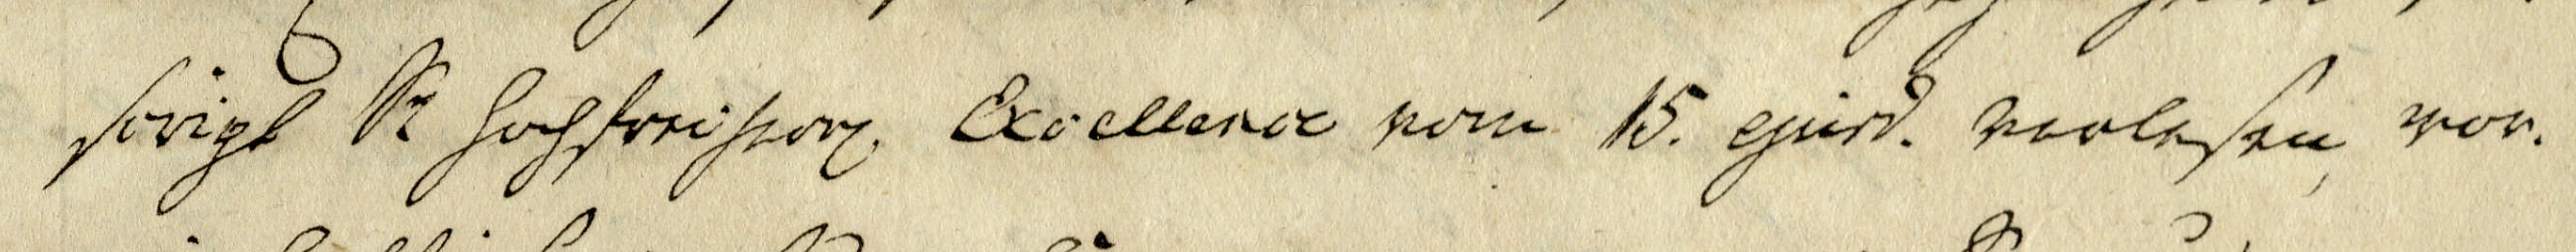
script Sr. hochfreiherrl. Excellence vom 15. ejusd. verlesen wor¬
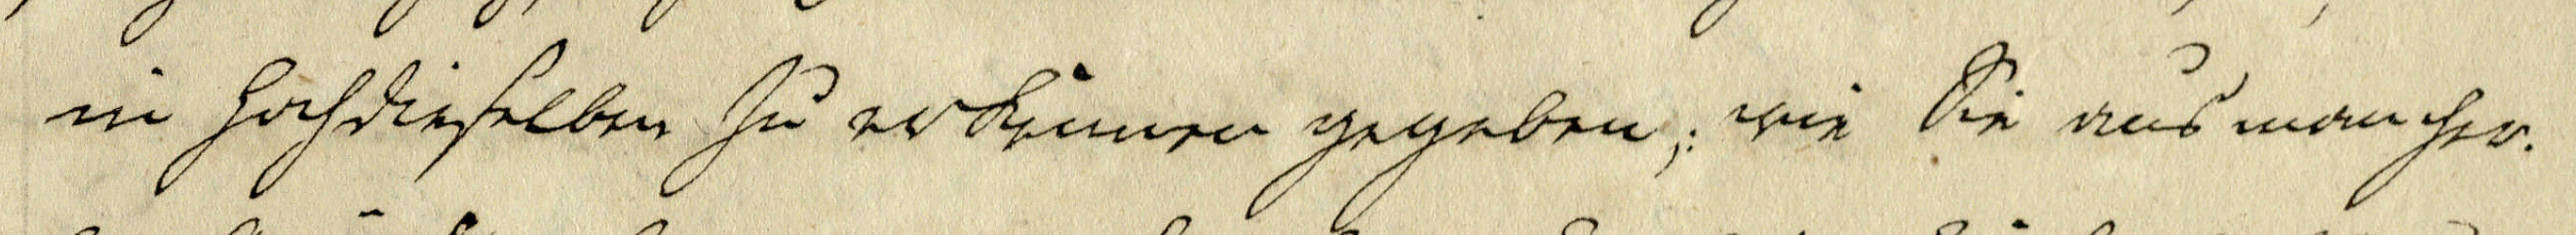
in Hochdieselben zu erkennen gegeben, wie Sie aus mancher¬
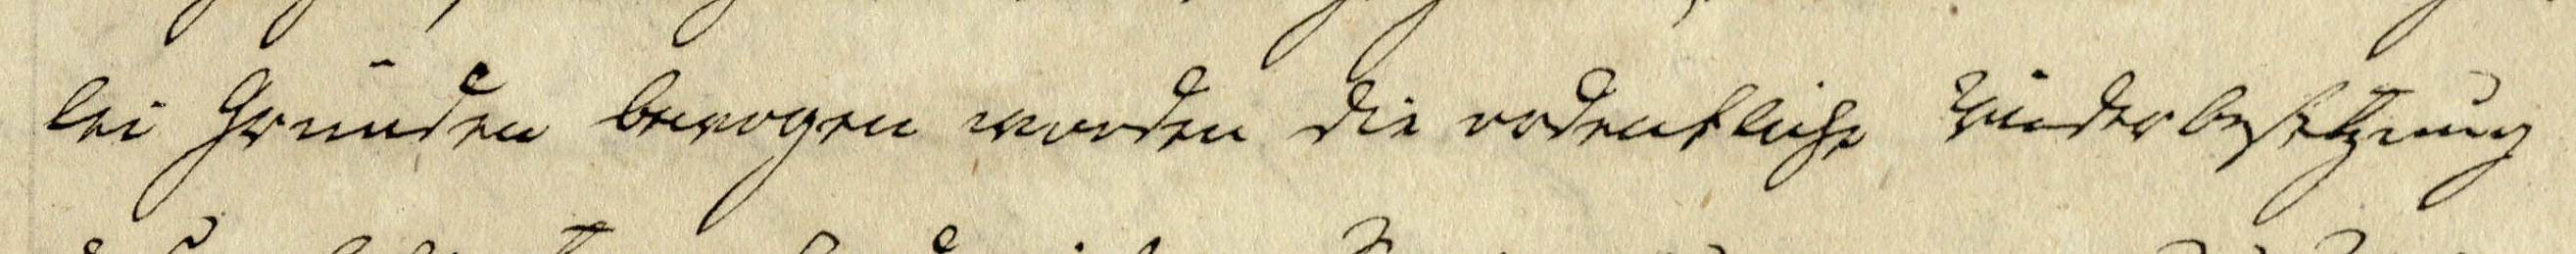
lei Gründen bewogen worden die ordentliche Wiederbesetzung
